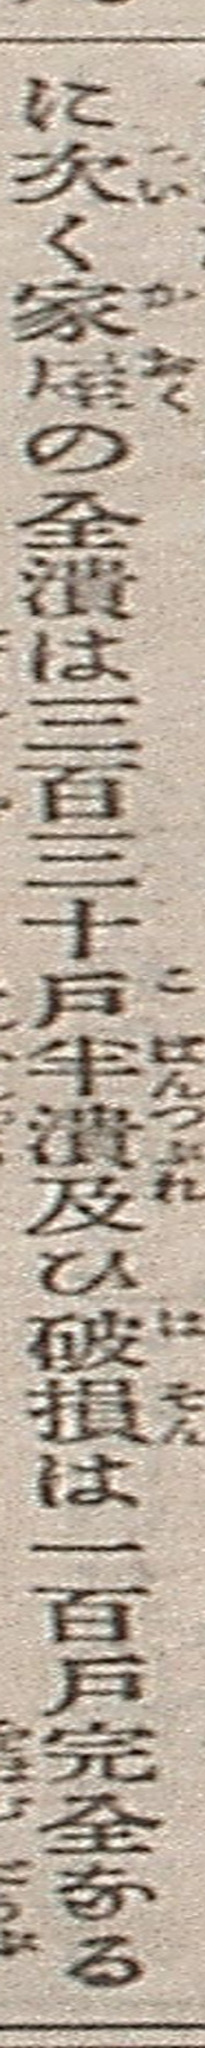に次く家屋の全潰は三百三十戸半潰及ひ破損は一百戸完全なる
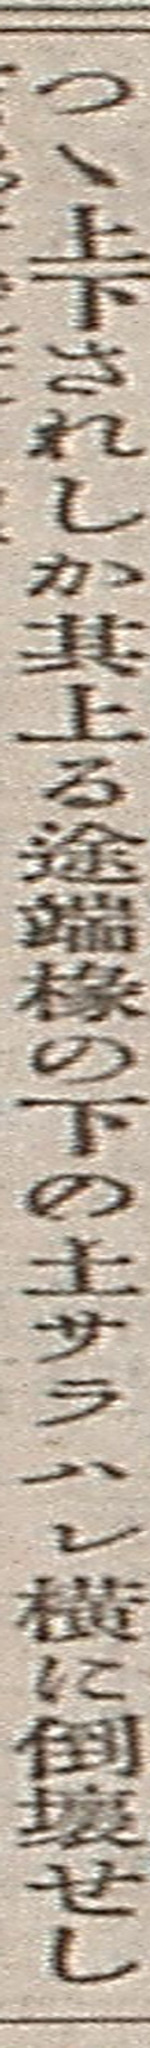つゝ上下されしか其上る途端橡の下の土サラハレ横に倒壊せし
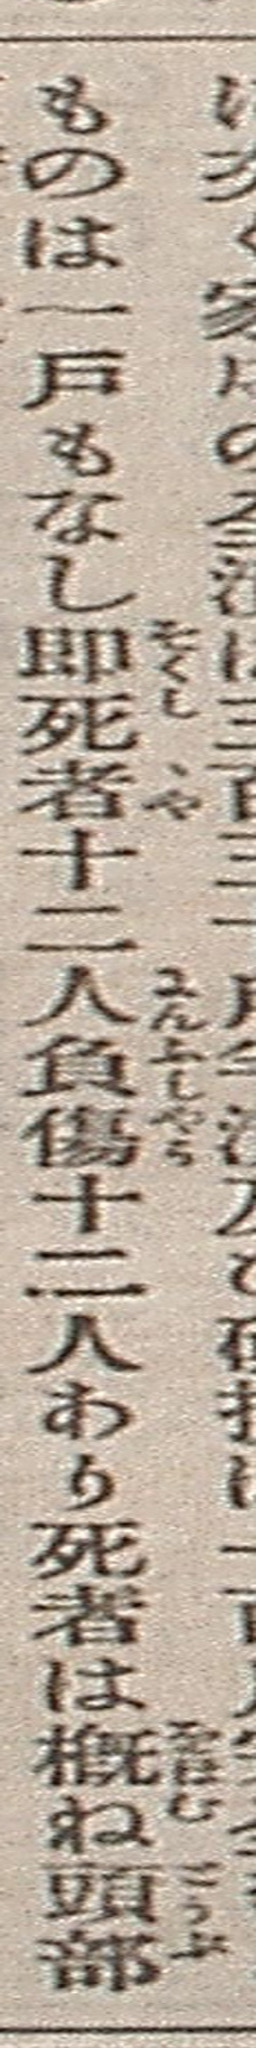ものは一戸もなし即死者十二人負傷十二人あり死者は概ね頭部
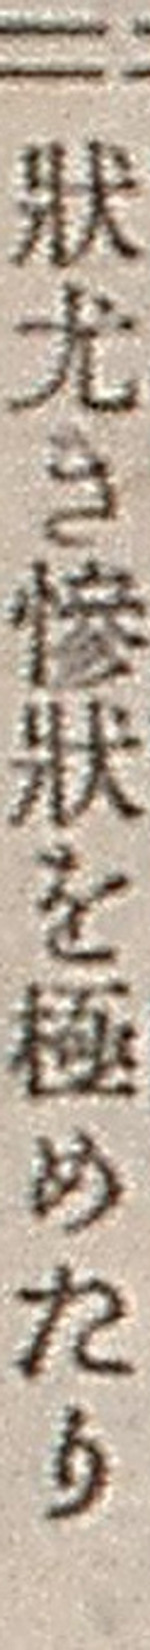状尤き惨状を極めたり
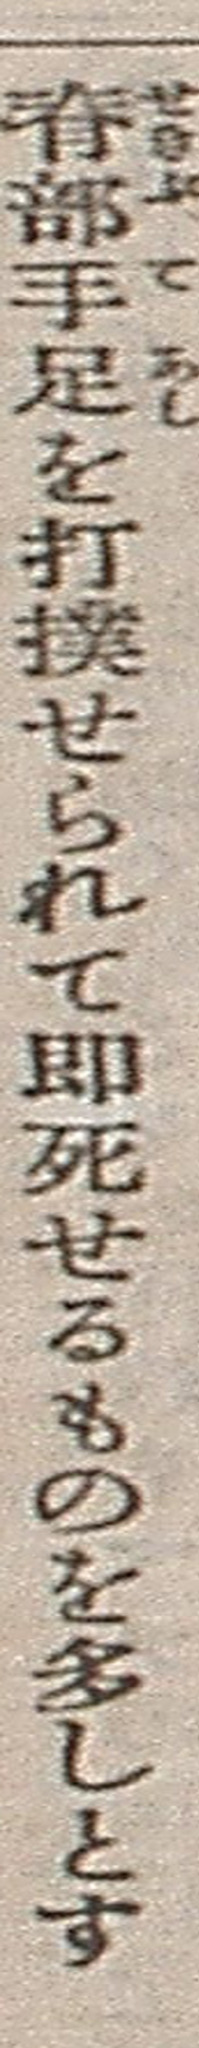脊部手足を打撲せられて即死せっるものを多しとす

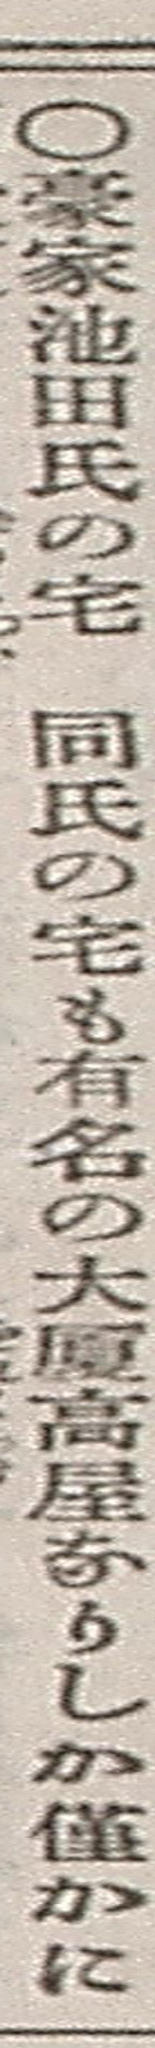〇豪家池田氏の宅同氏の宅も有名の大厦高屋なりしか僅かに
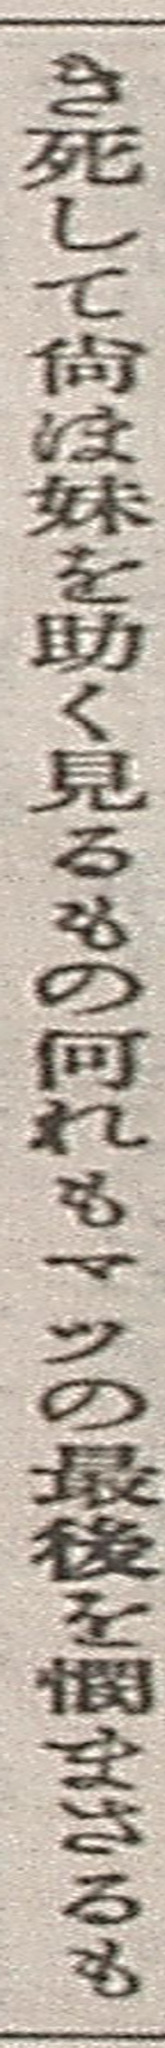き死して尚ほ妹を助く見るもの何れもマツの最後を憫まさるも
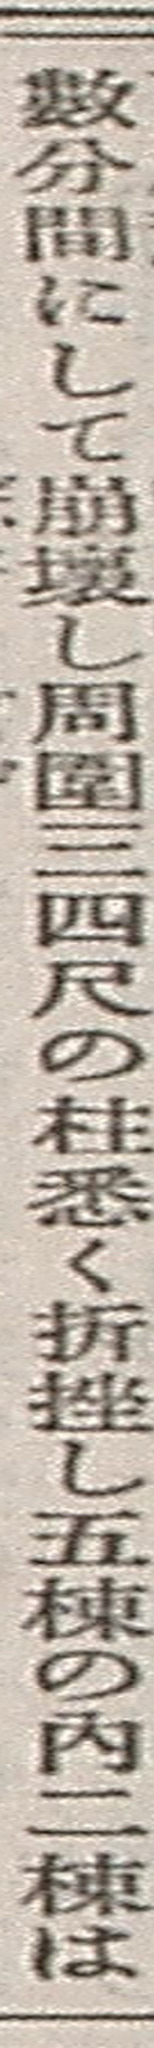数分間にして崩壊し周囲三四尺の柱悉く折挫し五棟の内ニ棟は
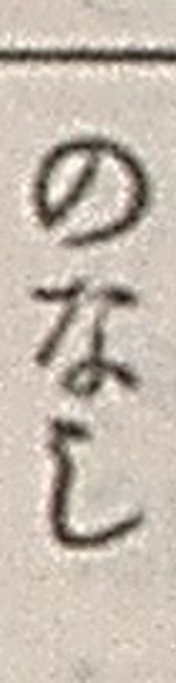のなし
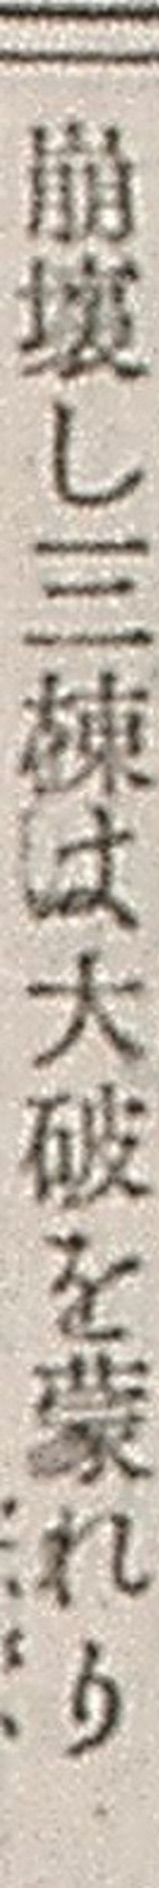崩壊し三棟は大破を蒙れり
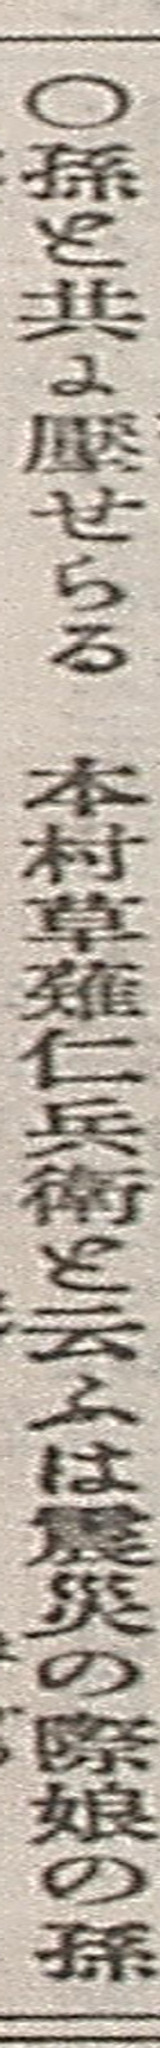〇孫と共に圧せらる本村草薙仁兵衛と云ふは震災の際娘の孫
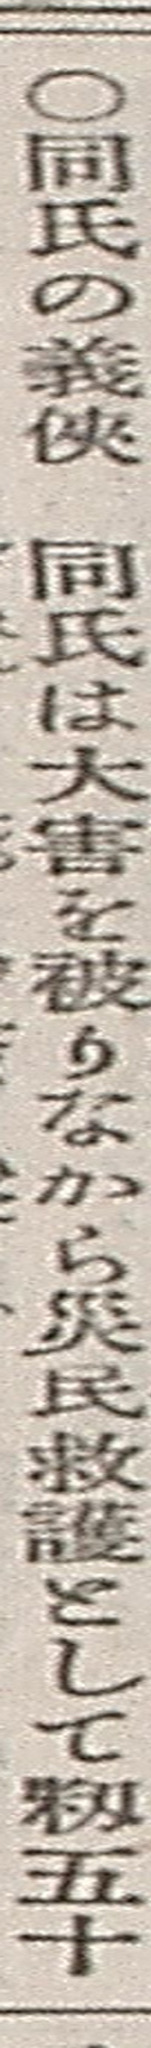〇同氏の義侠同氏は大害を被りなから災民救護として籾五十
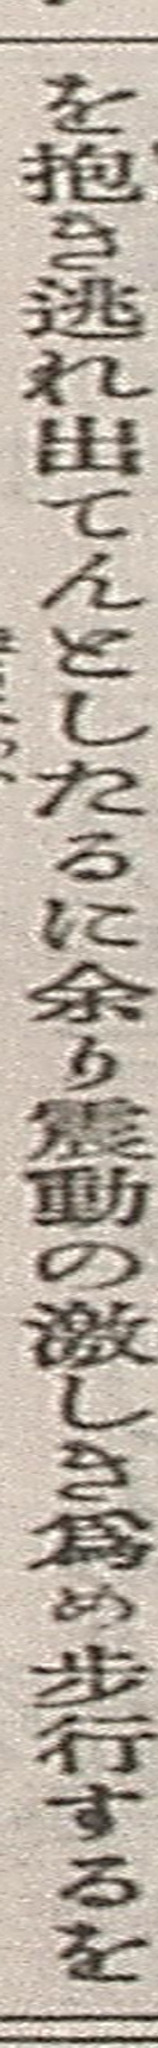を抱き逃れ出てんとしたるに余り震動の激しき為め歩行するを
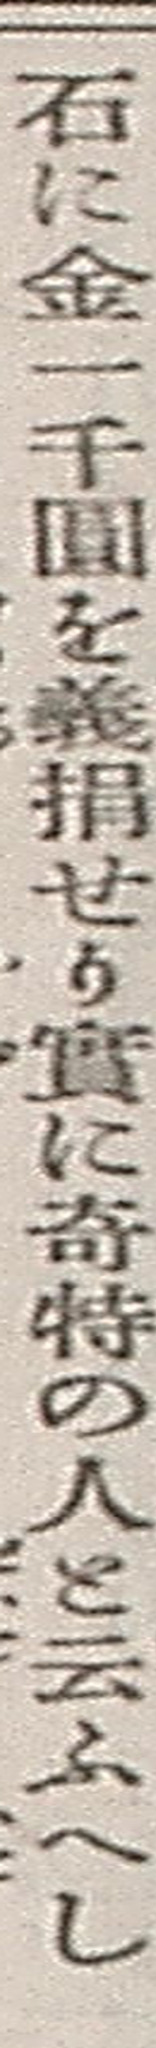石に金一千円を義捐せり実に奇特の人と云ふへし
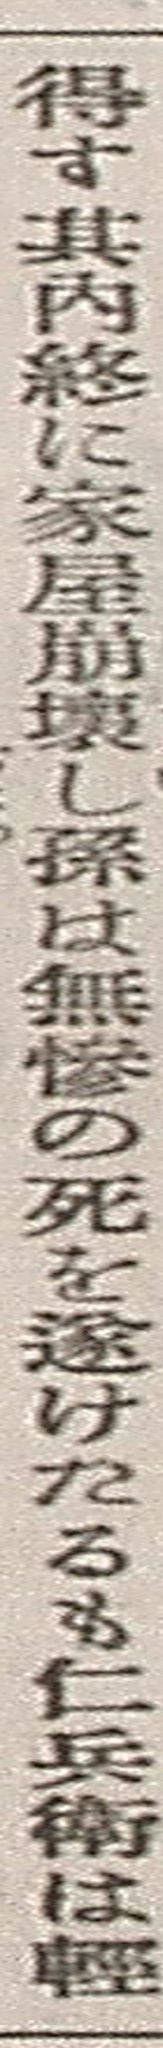得す其内終に家屋崩壊し孫は無惨の死を遂けたるも仁兵衛は軽
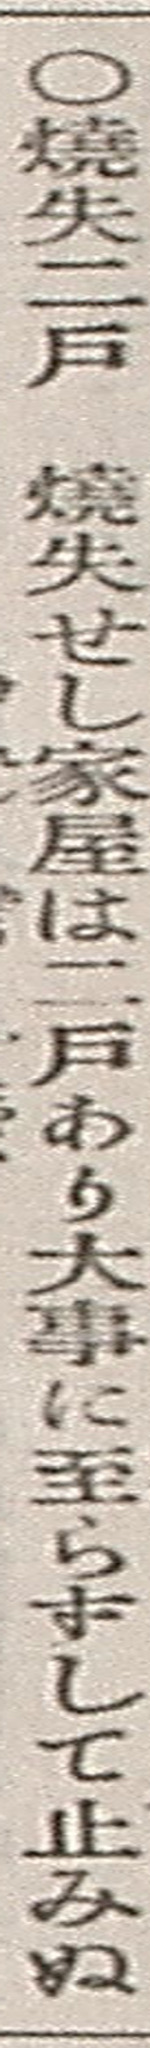〇焼失ニ戸焼失せし家屋は二戸あり大事に至らずして止みぬ
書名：風俗畫報臨時増刊第百二十四號　洪水地震被害録（上）
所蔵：東京大学地震研究所図書室 Earthquake Research Institute Library, The University of Tokyo, JAPAN
